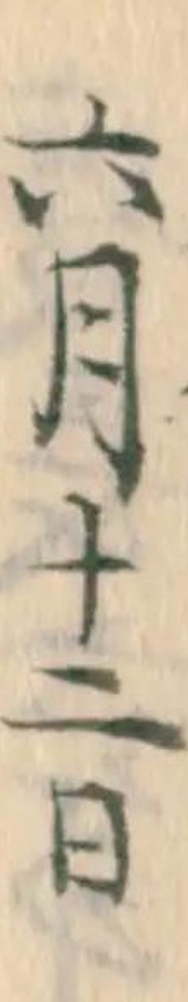六月十二日
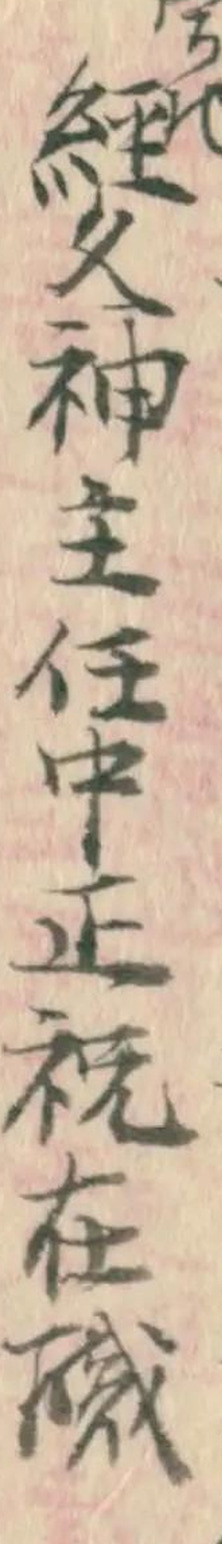三月廿七日経久神主任中正祝在職
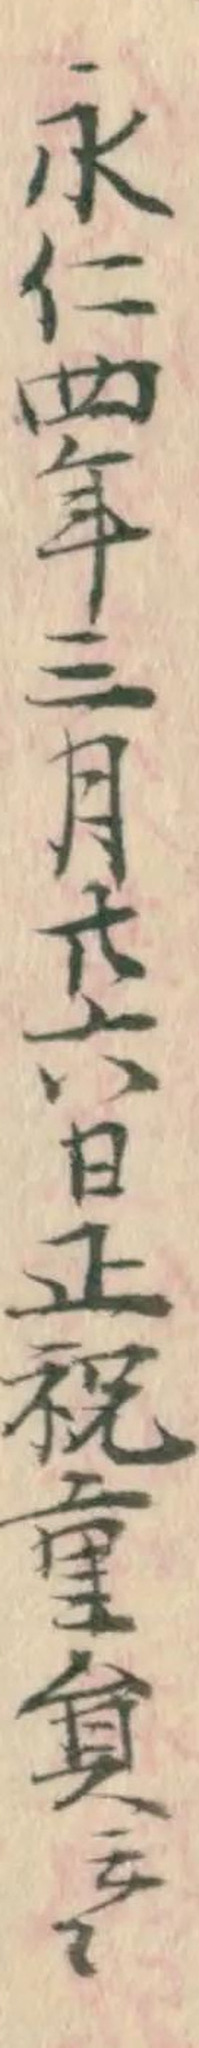永仁四年三月廿六日正祝重員云々
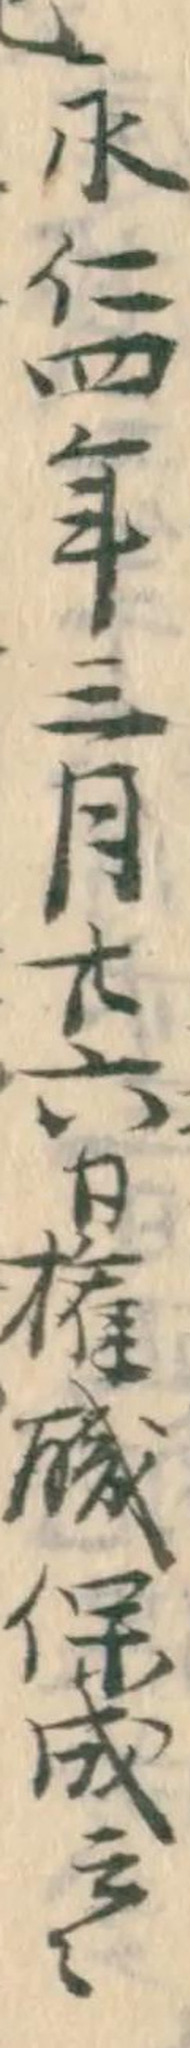保成永仁四年三月廿六日権職保成云々
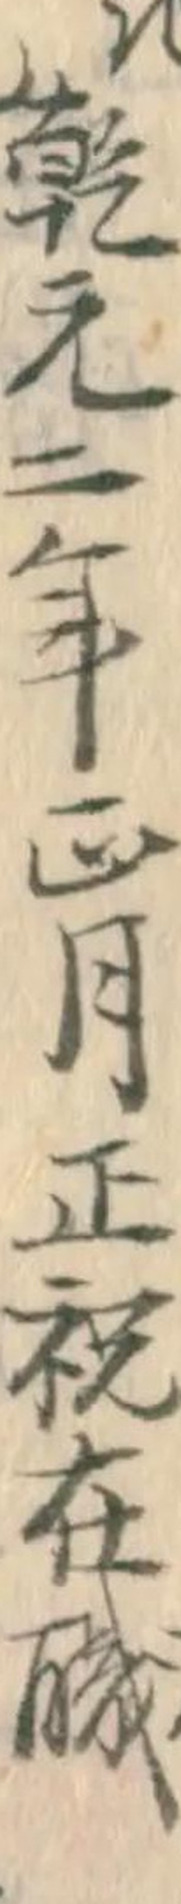乾元二年正月正祝在職

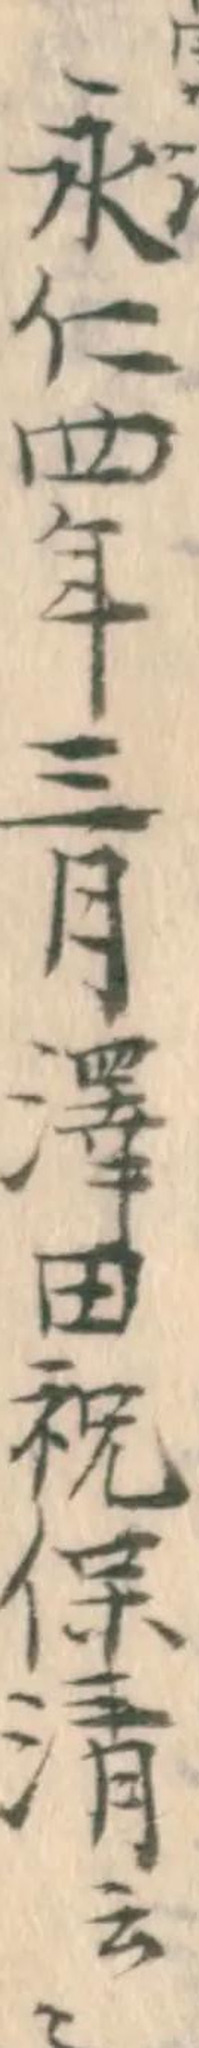永仁四年三月澤田祝保清云々
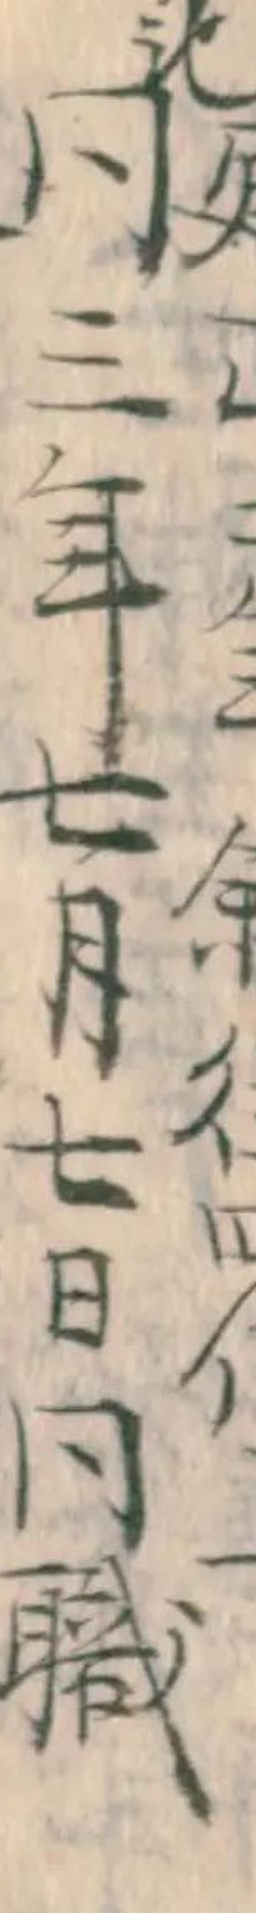同三年七月七日同職
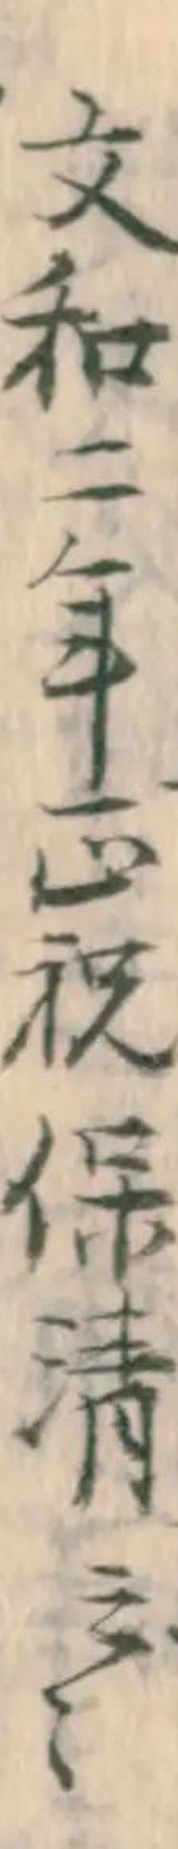文和二年正祝保清云々
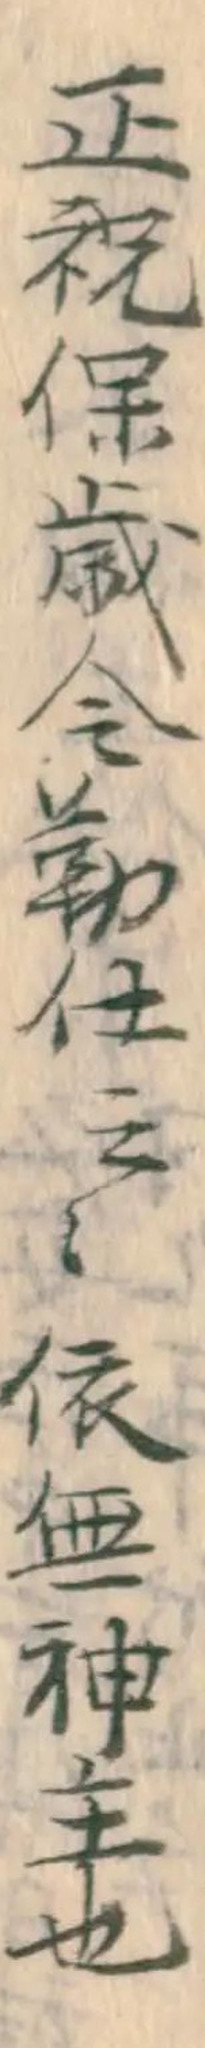月日正祝保歳令勤仕云々依無神主也
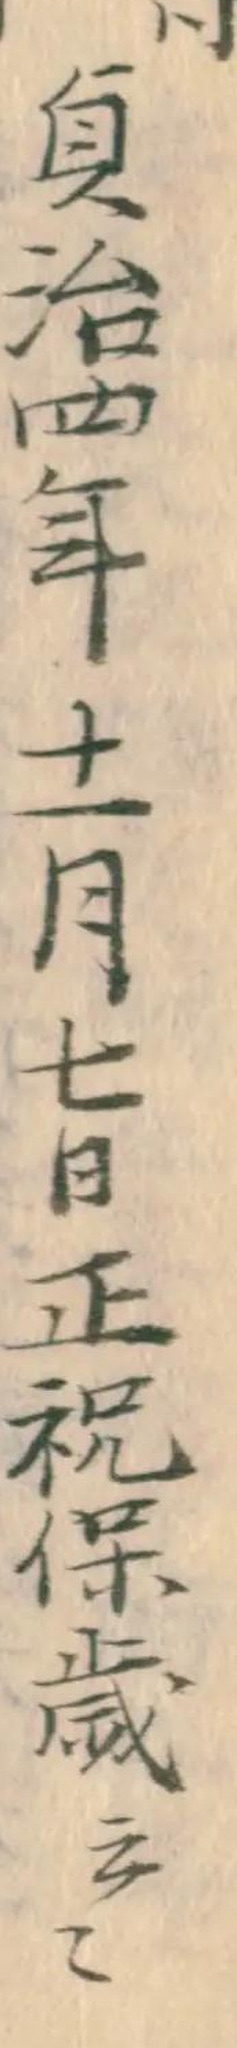貞治四年十一月七日正祝保歳云々
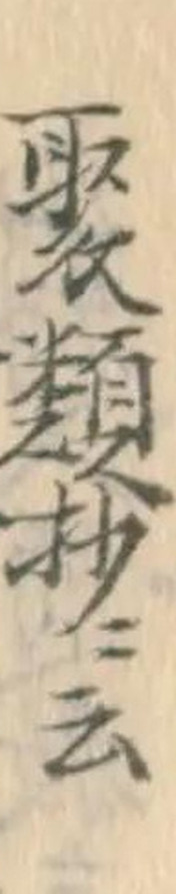聚類抄ニ云
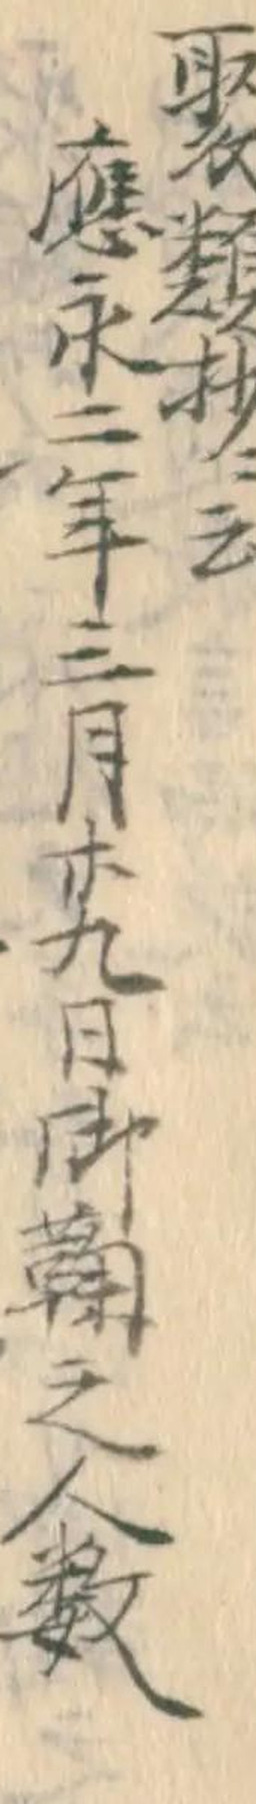応永二年三月廿九日御鞠之人数
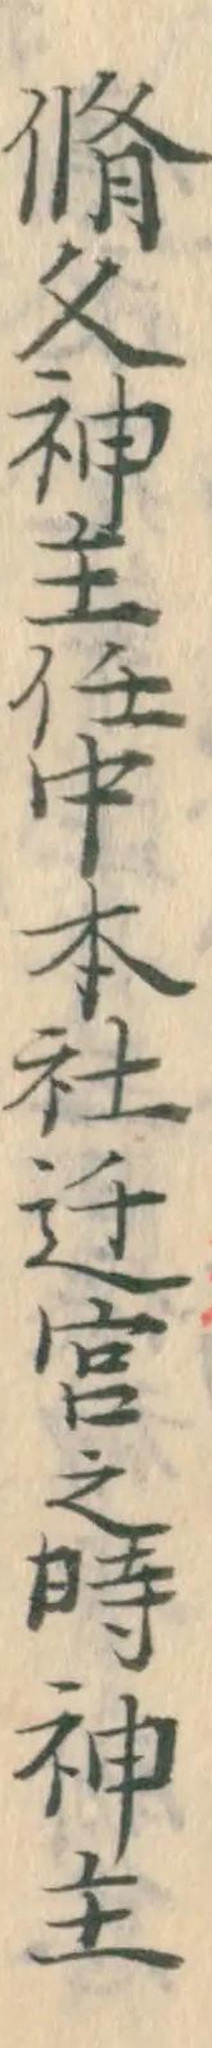重家脩久神主任中本社遷宮之時神主
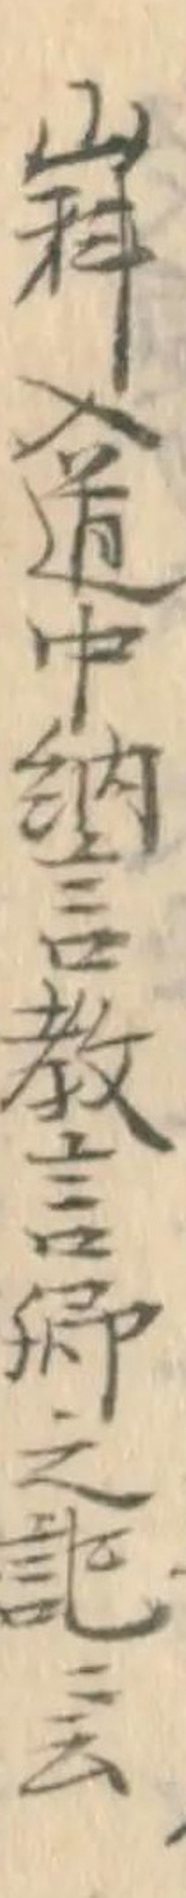山科入道中納言教言卿之記ニ云
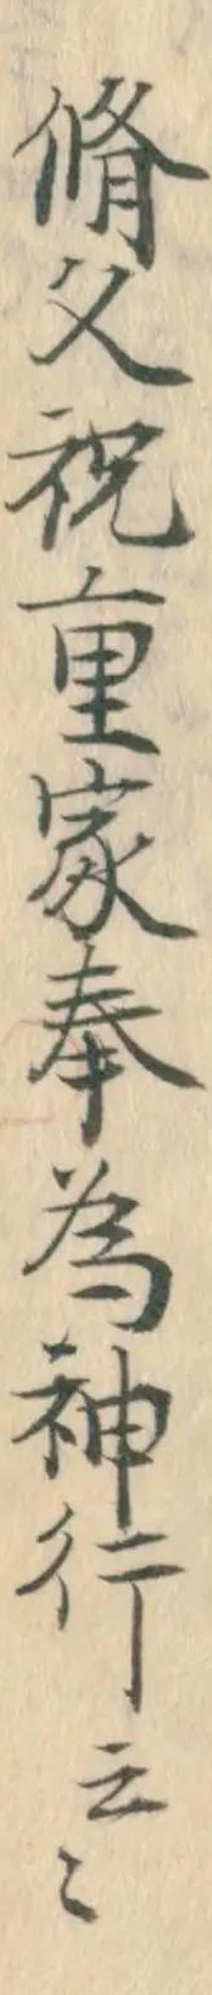脩久祝重家奉為神行云々
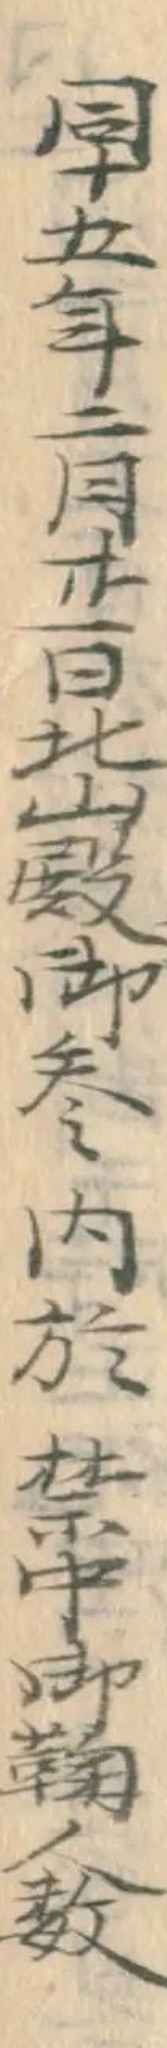同十五年二月廿一日北山殿御参内於禁中御鞠人数
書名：賀茂社記録. 第23冊
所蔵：国立国会図書館 National Diet Library, JAPAN
